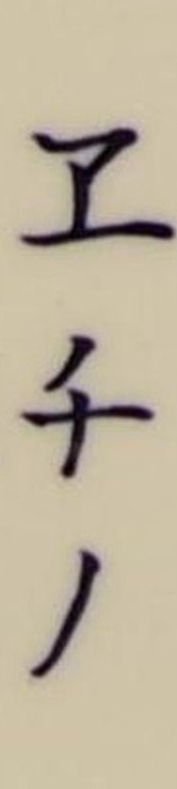ヱチノ
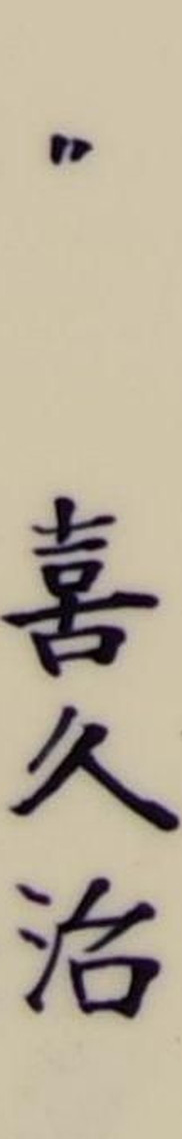喜久治
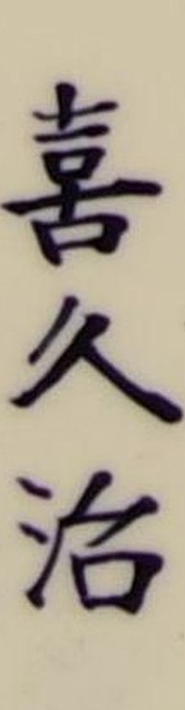喜久治
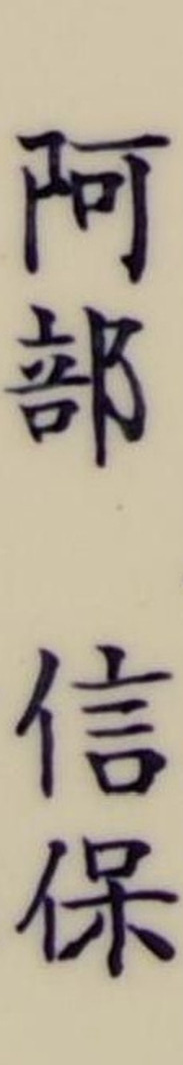阿部信保
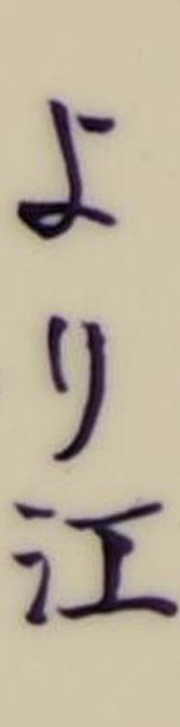より江

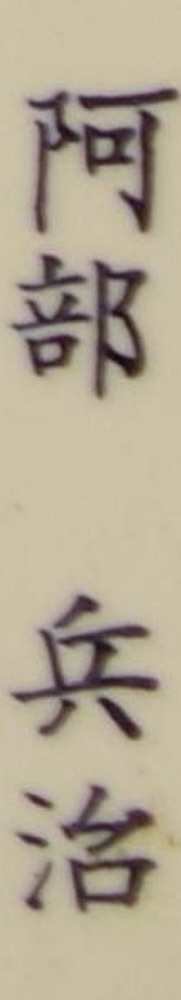阿部兵治
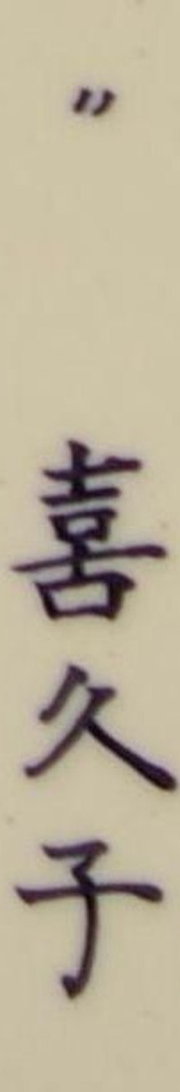喜久子
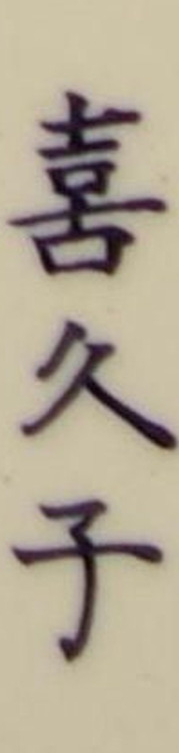喜久子
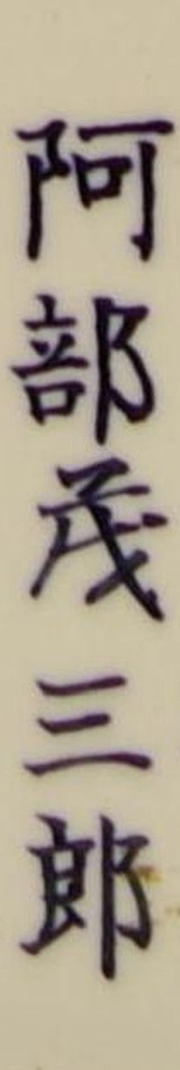阿部茂三郎
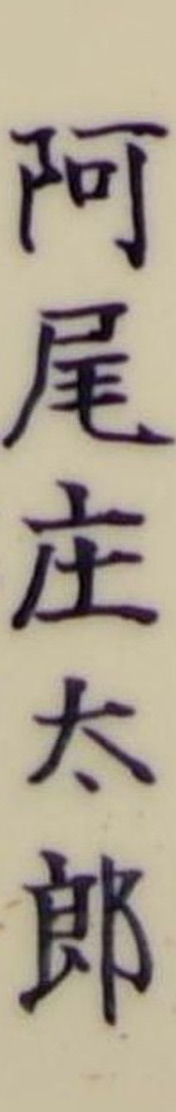阿尾庄太郎
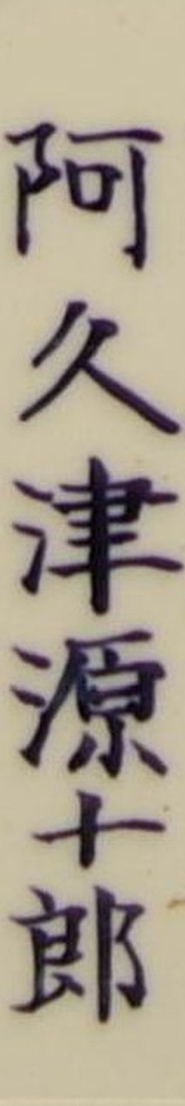阿久津源十郎
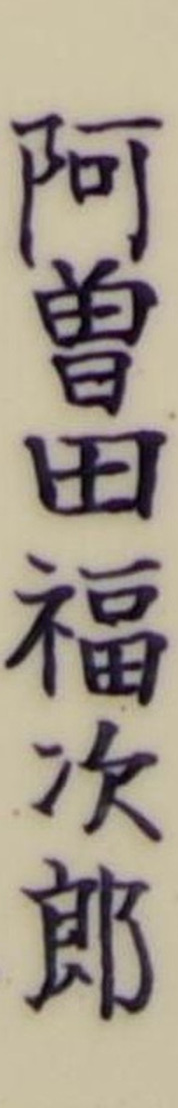阿曽田福次郎
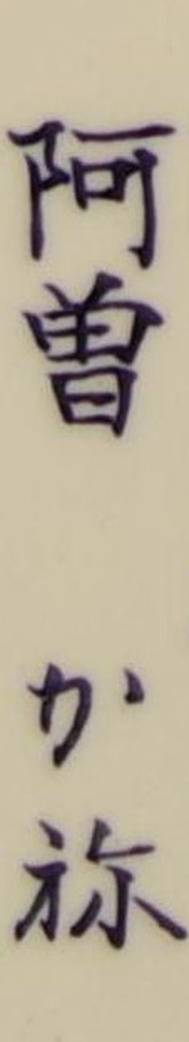阿曽かね
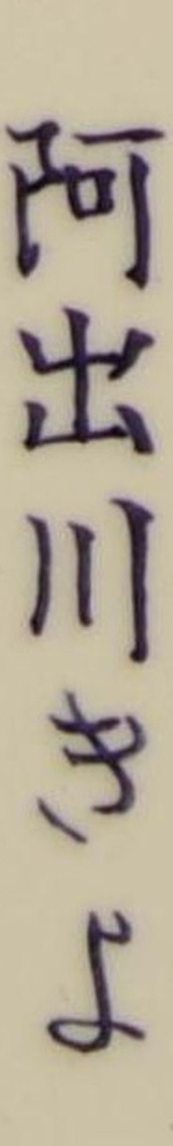阿出川きよ
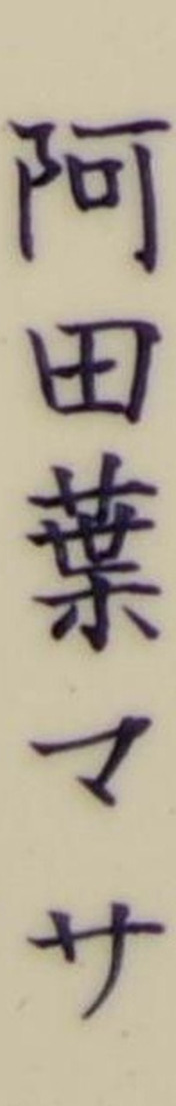阿田葉マサ
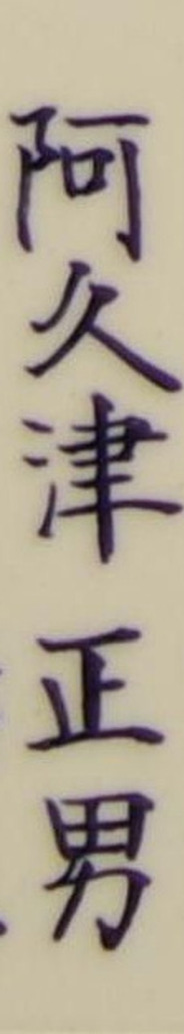阿久津正男
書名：E~L
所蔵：高野山金剛峯寺
